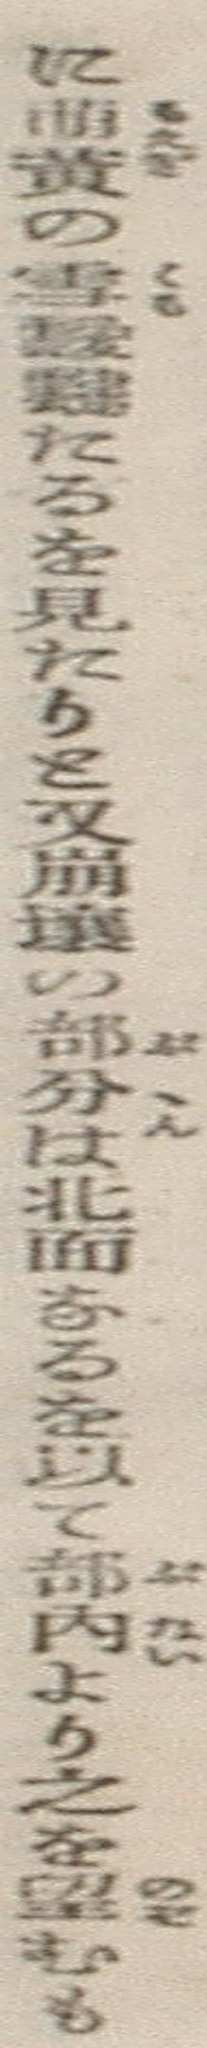に萌黄の雲靉靆たるを見たりと又崩壊の部分は北面なるを以て部内より之を望むも
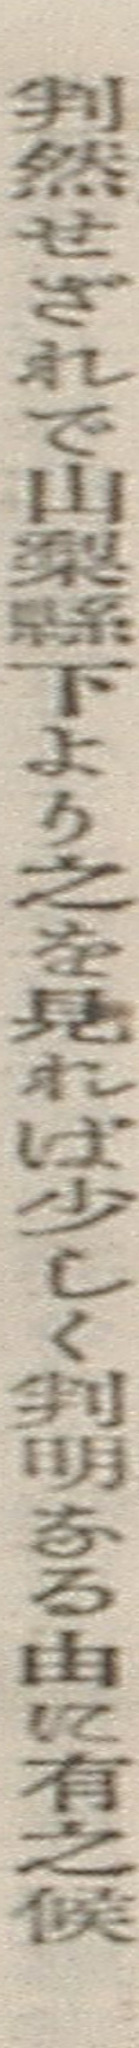判然せざれで山梨縣下より之を見れば少しく判明なる由に有之候
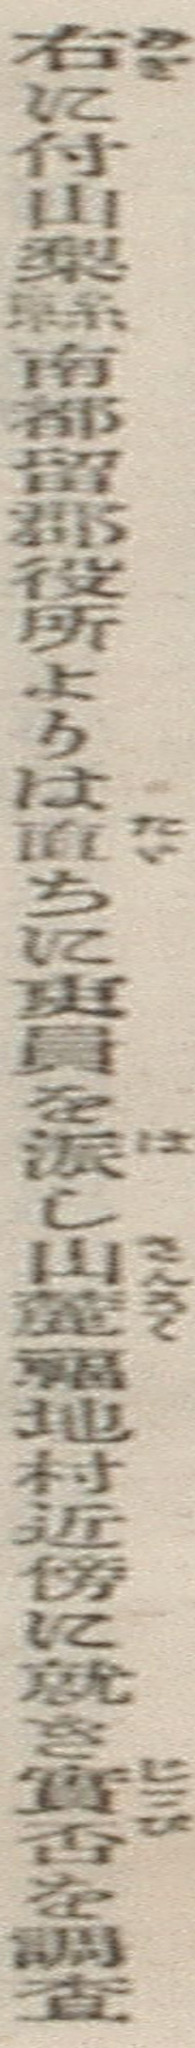右に付山梨縣南都留郡役所より直ちに吏員を派し山麓福地村近傍に就き實否を調査
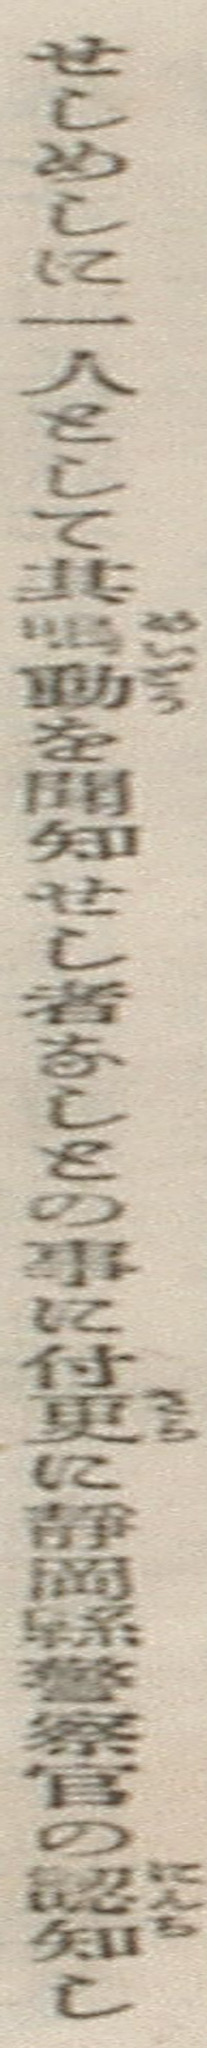せしめしに一人として其鳴動を聞知せし者なしとの事に付更に静岡縣警察官の認知し
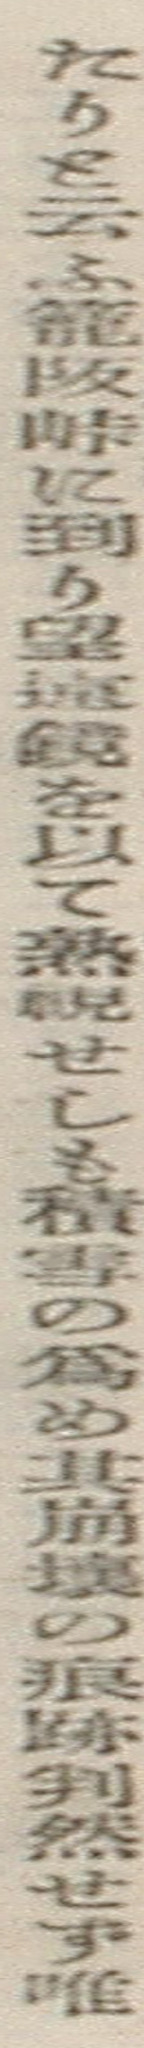たりと云ふ籠阪峠に到り望遠鏡を以て熟視せしも積雪の為め其崩壊の痕跡判然せず唯
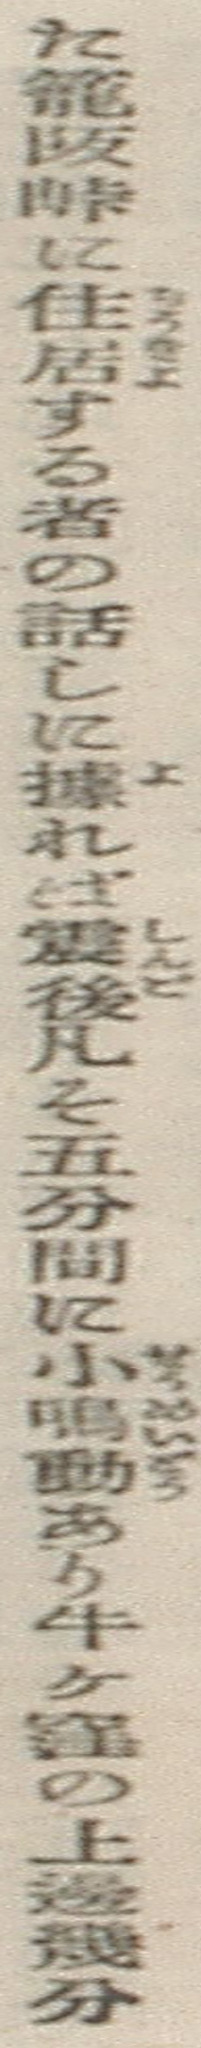た籠阪峠に住居する者の話しに據れば震後凡そ五分間に少鳴動あり牛ヶ窪の上邊幾分
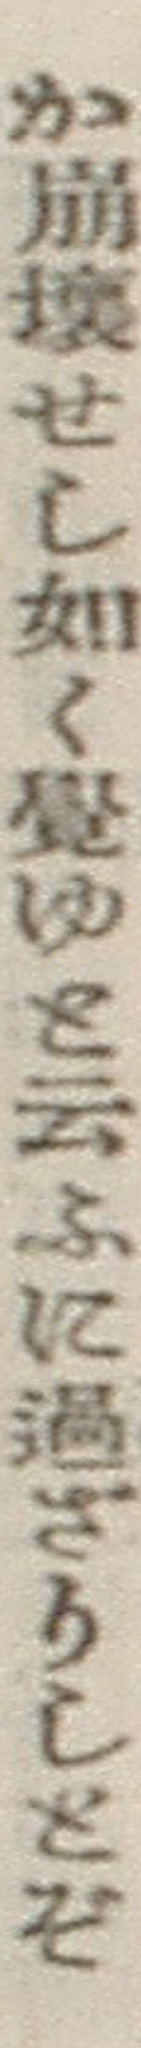か崩壊せし如く覚ゆと云ふに過ざりしとぞ
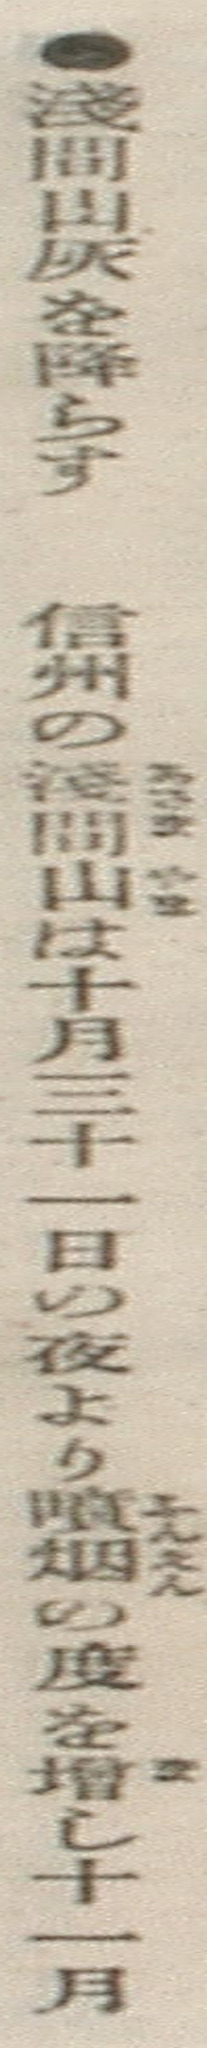●浅間山灰を降らす信州の浅間山は十月三十一日の夜より噴烟の度を増し十一月
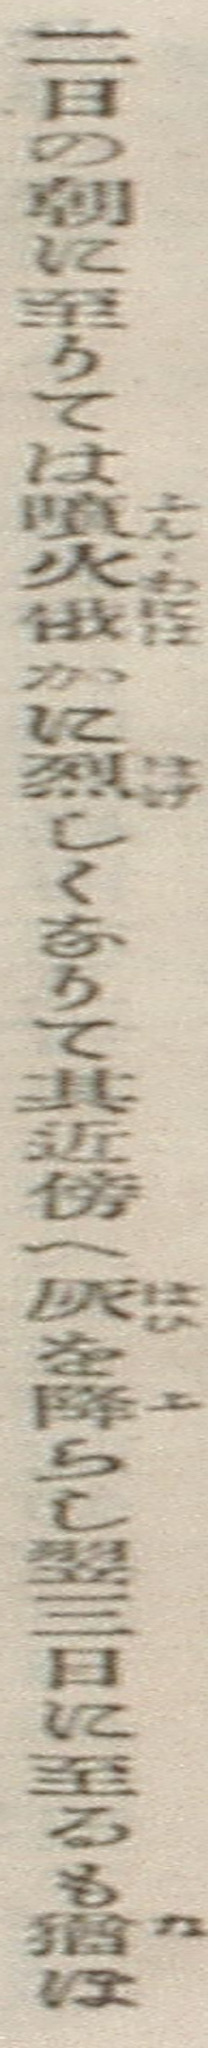二日の朝に至りては噴火俄かに烈しくなりて其近傍へ灰を降らし翌三日に至るも猶ほ
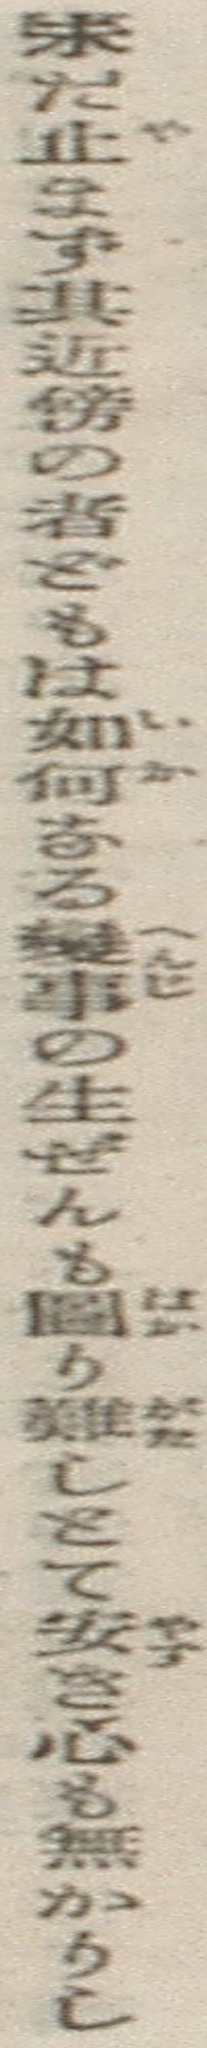未だ止まず其近傍の者どもは如何なる變事の生ぜんも圖り難しとて安き心も無かりし

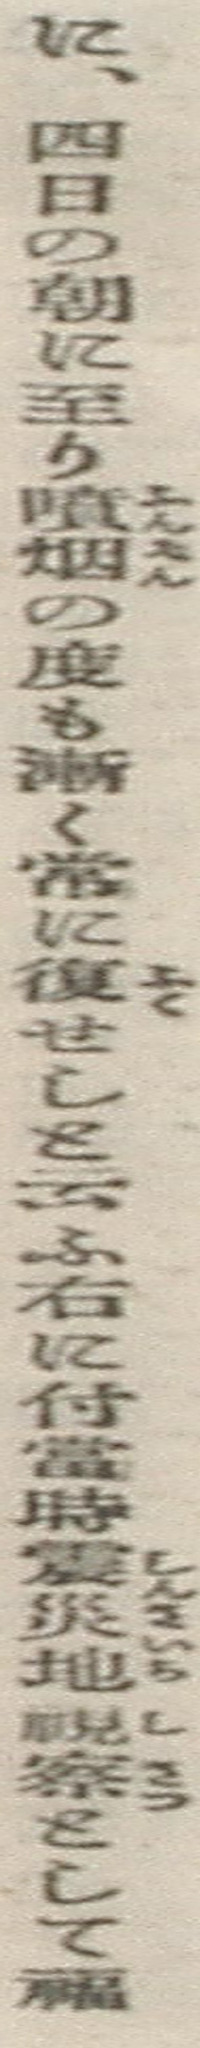に、四日の朝に至り噴烟の度も漸く常に復せしと云ふ右に付当時震災地視察として福
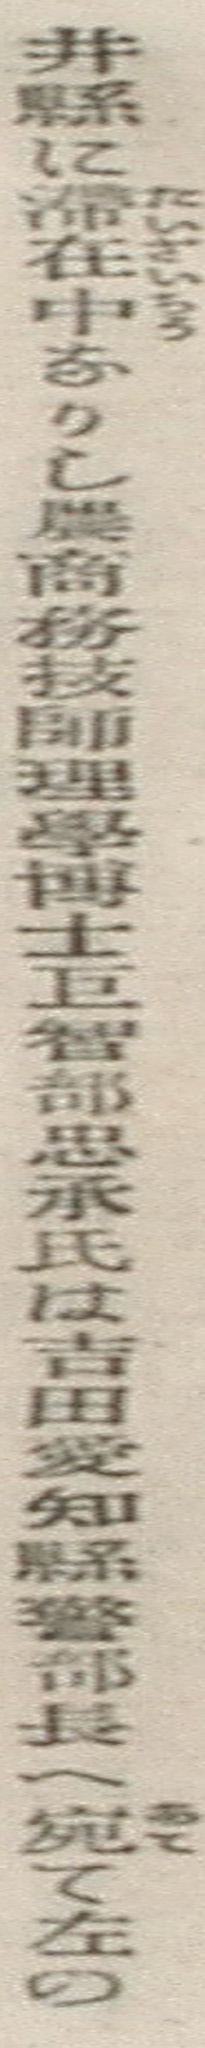井縣に滞在中なりし農商務技師理学博士巨智部忠承氏は吉田愛知縣警部長へ宛て左の
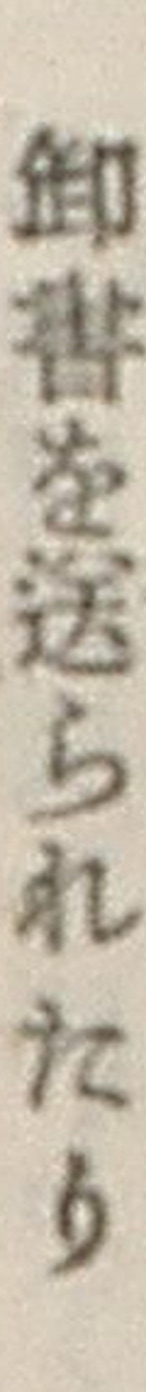御書を送られたり
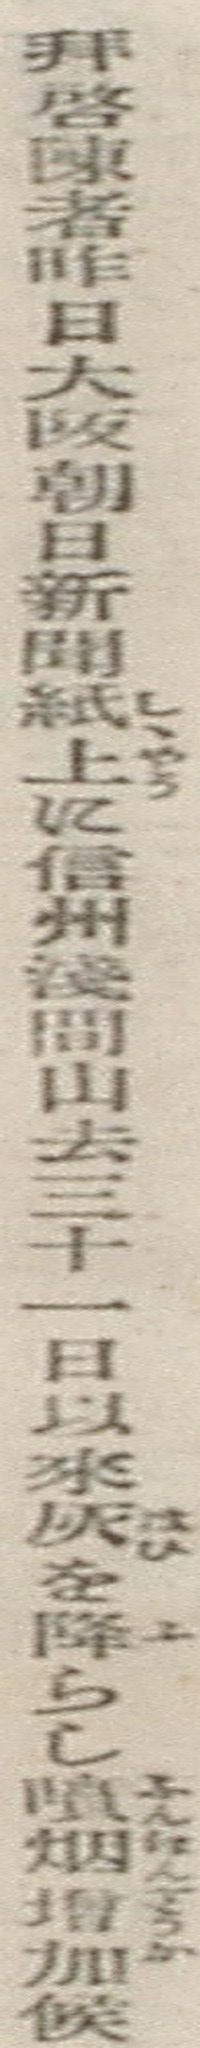拝啓陳者昨日大阪朝日新聞紙上に信州浅間山去三十一日以来灰を降らし噴烟増加候
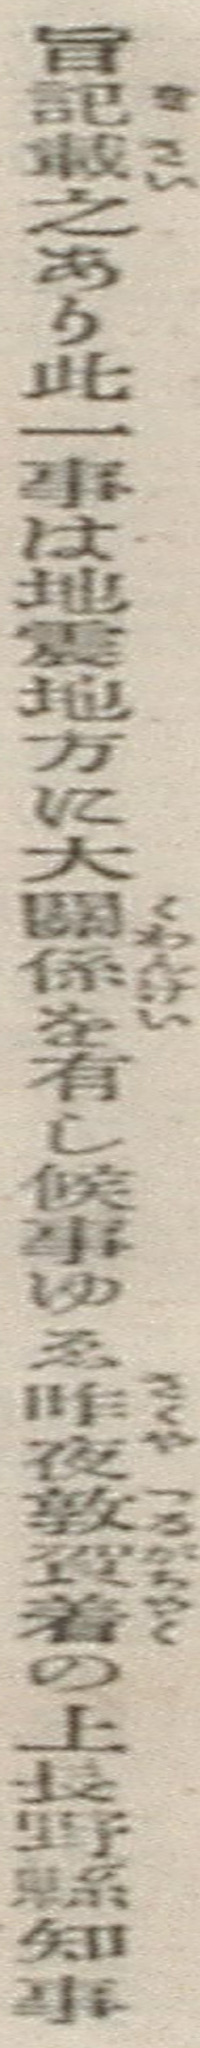旨記載之あり此一事は地震地方に大関係を有し候事ゆゑ昨夜敦賀着の上長野縣知事
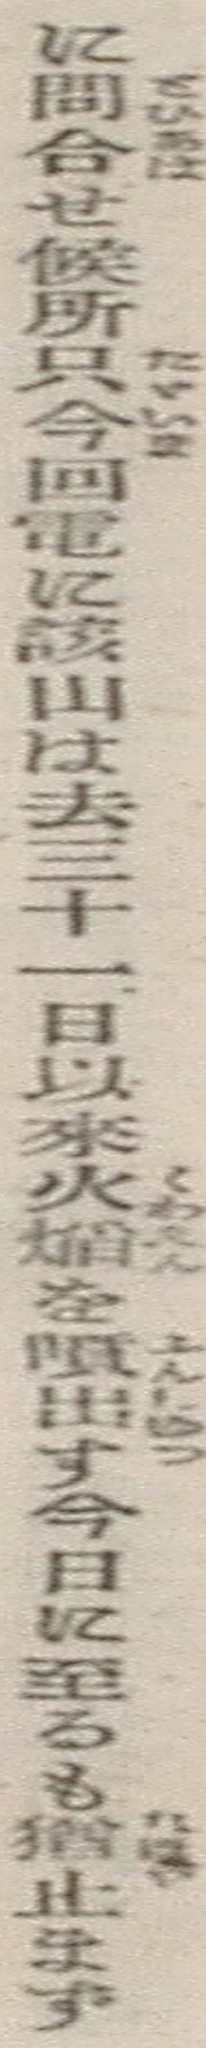に問合せ候所只今回電に該山は去三十一日以来火焔を噴出す今日に至るも猶止まず
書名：愛知岐阜福井三県　大地震見聞録（内題）
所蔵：東京大学地震研究所図書室 Earthquake Research Institute Library, The University of Tokyo, JAPAN
